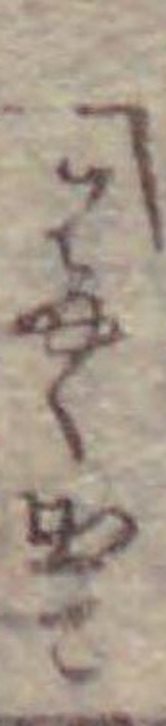〽はやく出て
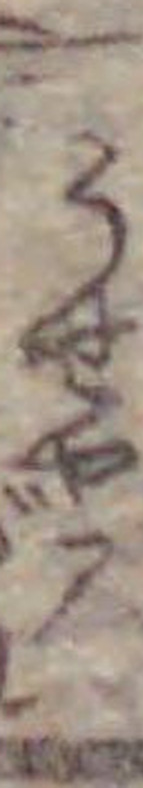うせやァ
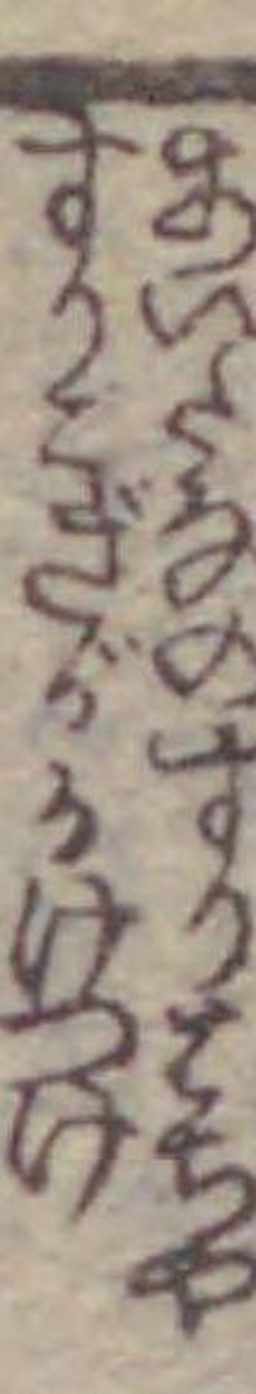すりこぎがかけつけ
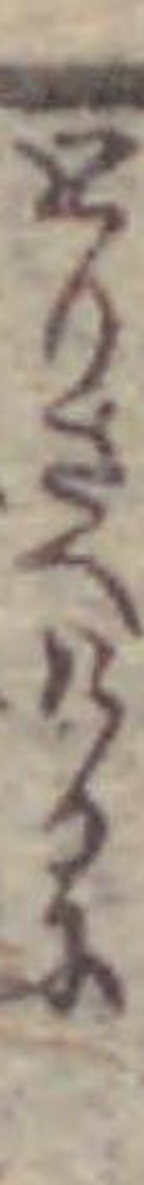とりさへけるに
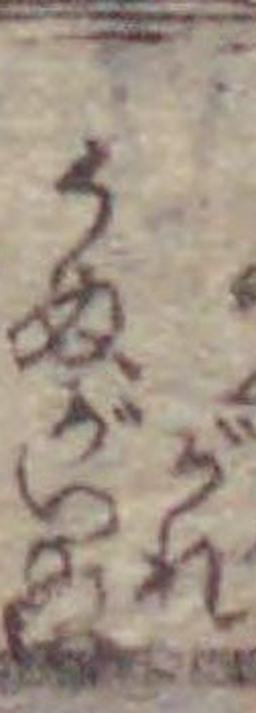うぬがいぬ
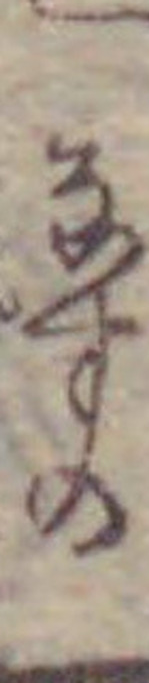なすの
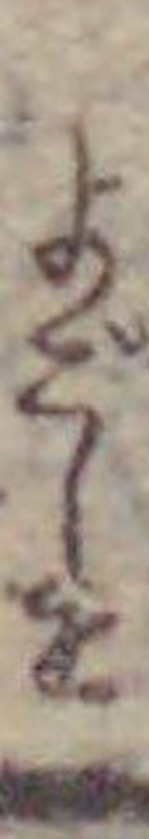よごしを
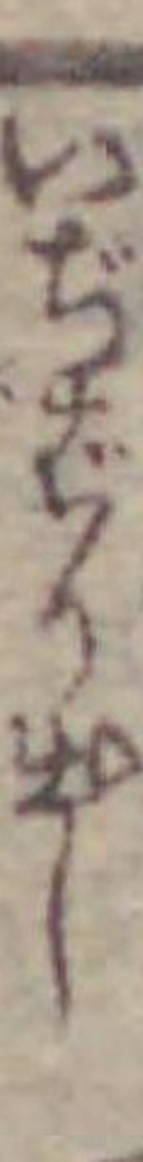いぢばり出し
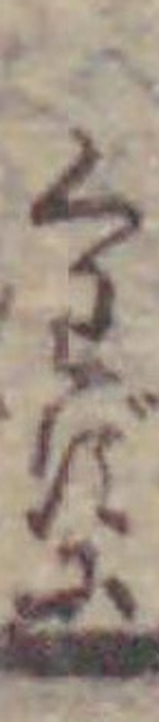くわずに
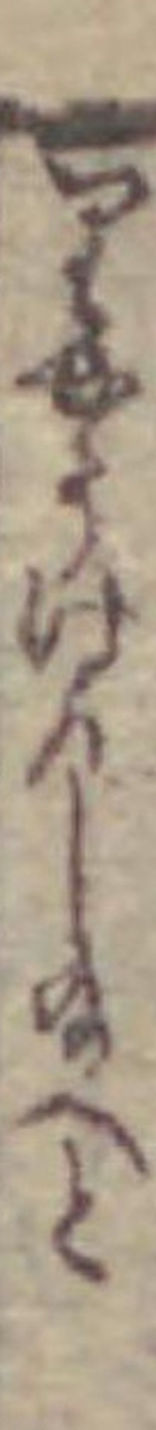りやうけんし給へと
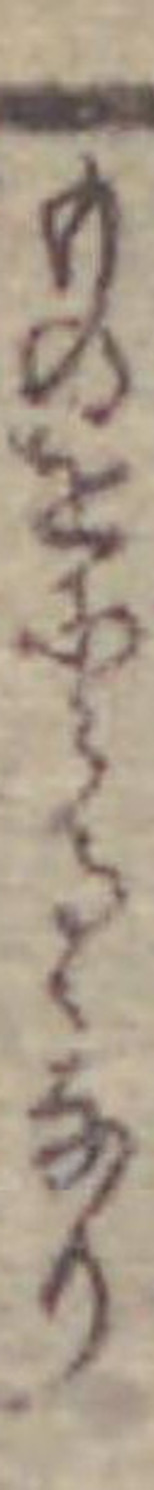ものをにらるゝなり
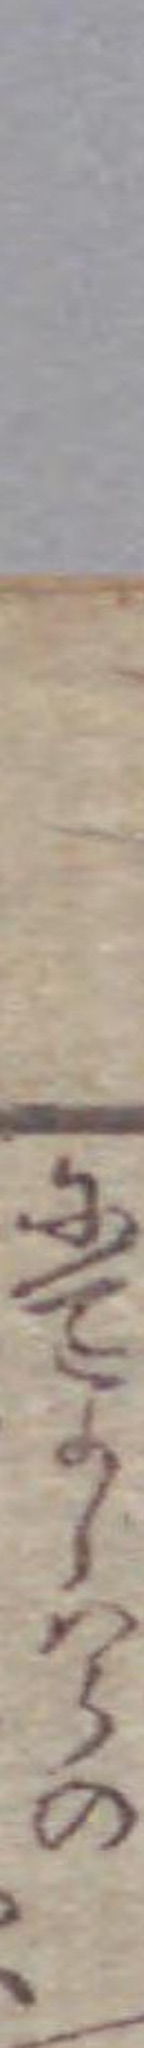にてよしはらの
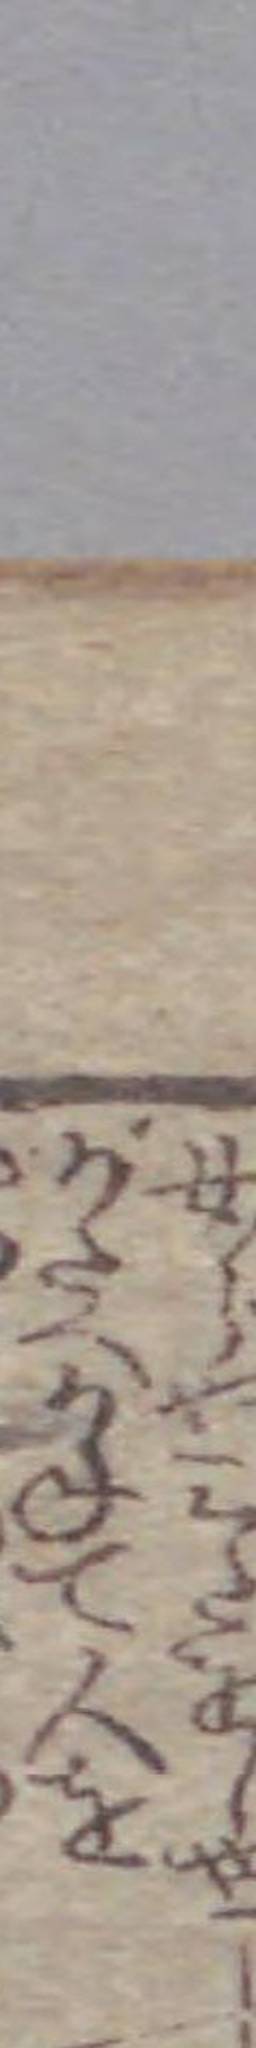かたへかねて人を
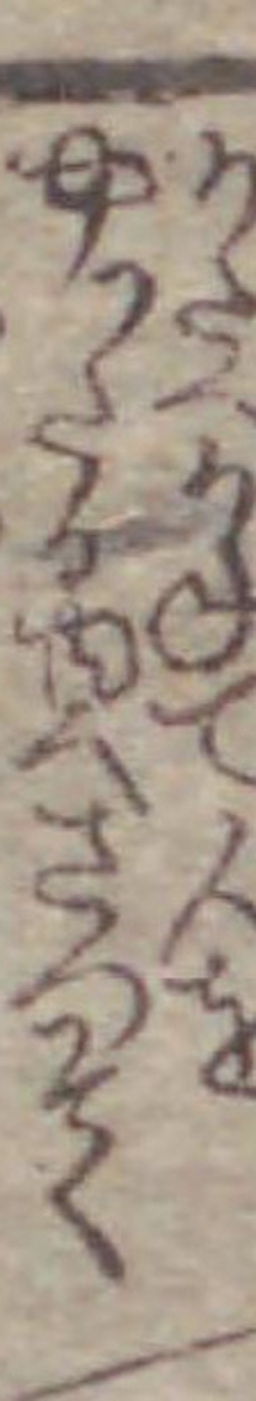やつたるゆへさつそく
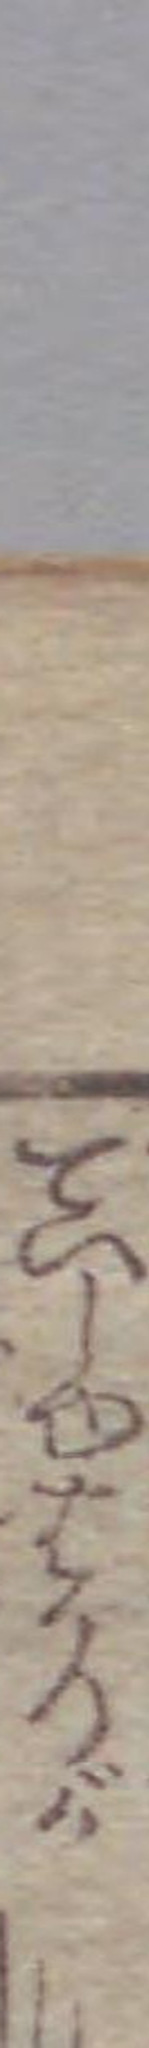ていしゆはかりが
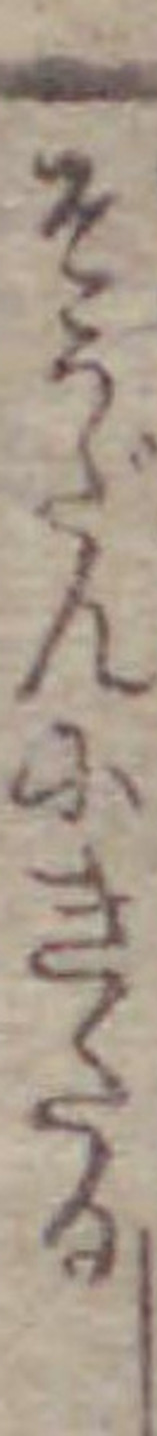そうだんにきたる
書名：万物小遣帳 : 2巻
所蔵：国立国会図書館 National Diet Library, JAPAN
